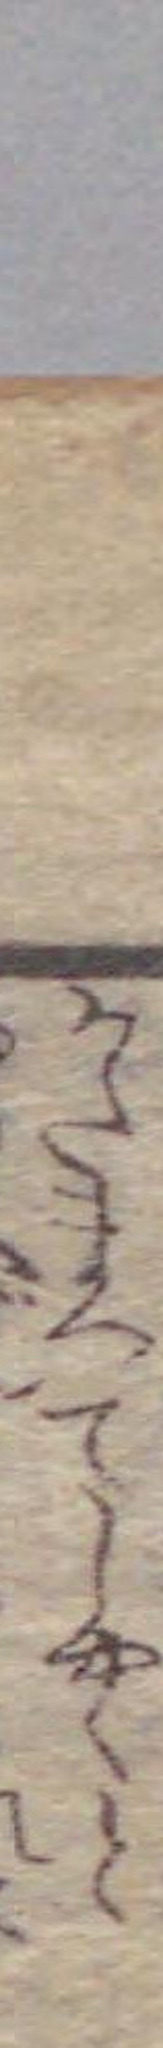かたまつてしやくと
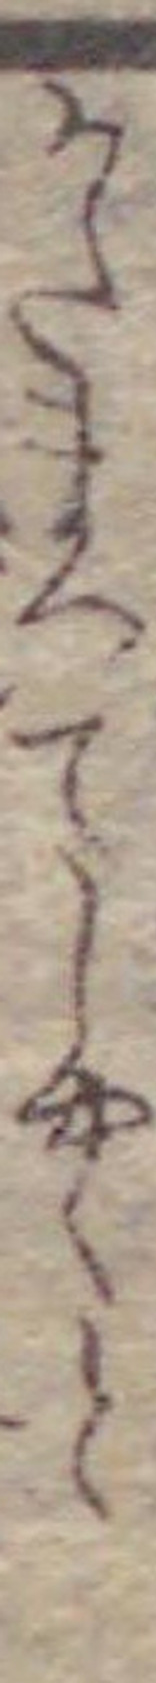かたまつてしやくと
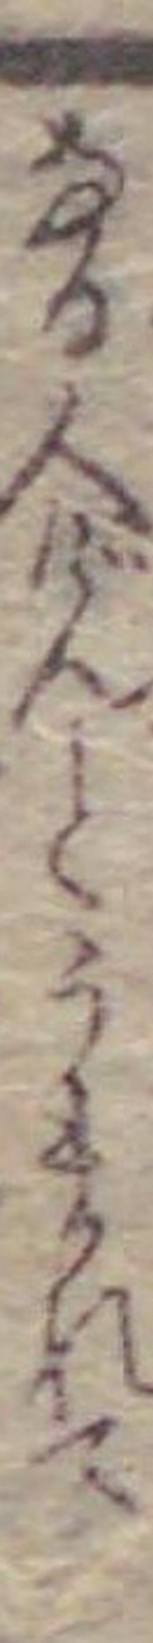なる人げんとうまれて
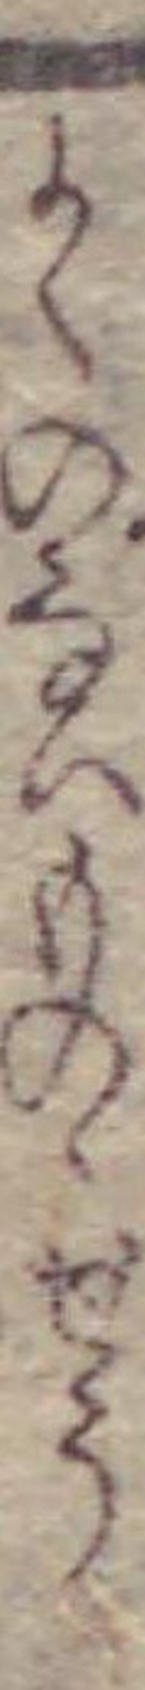よくのないものゝせう
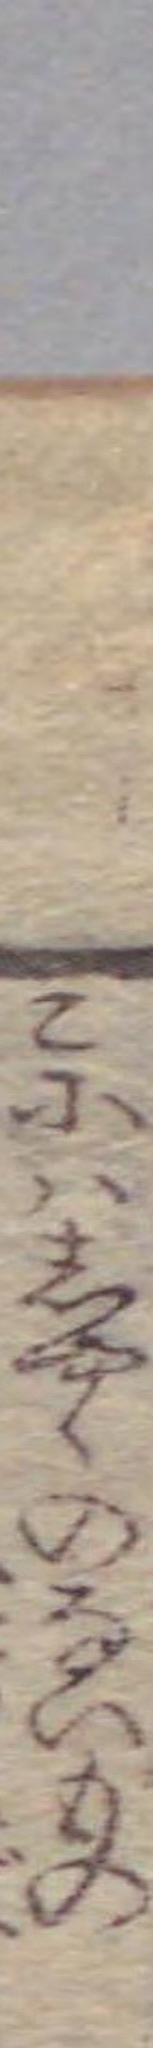こにはしやくのないもの
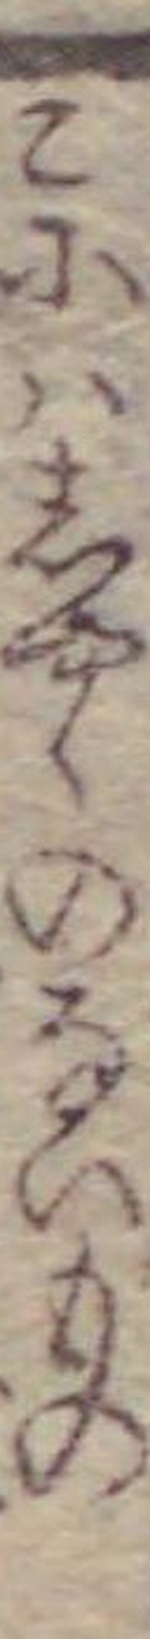こにはしやくのないもの
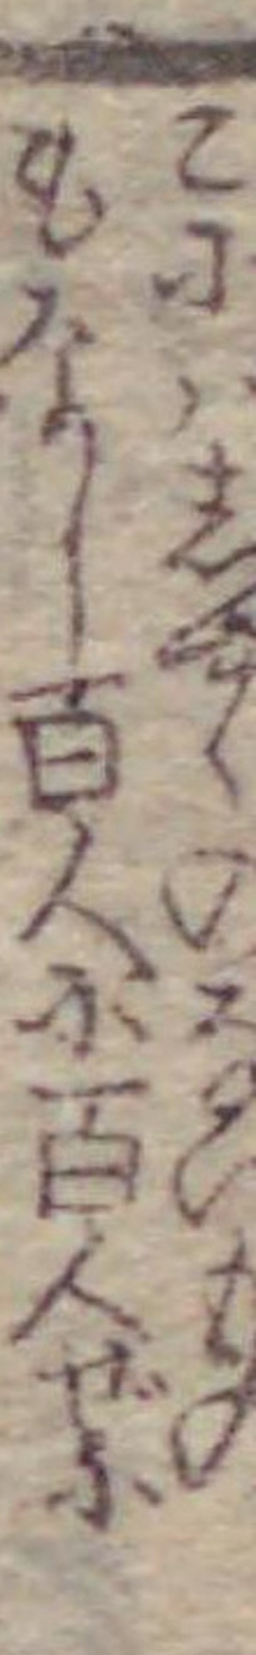もなし百人に百人ぜに
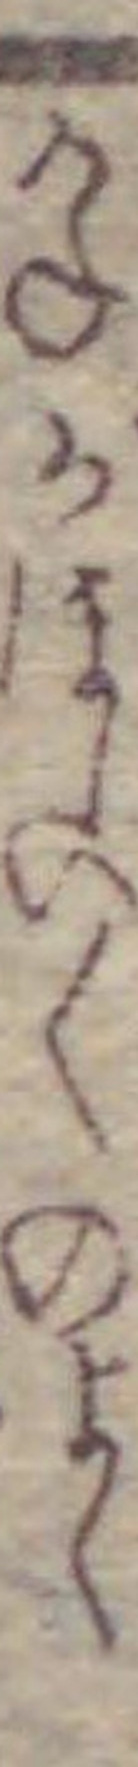かねがほしい〳〵のよく
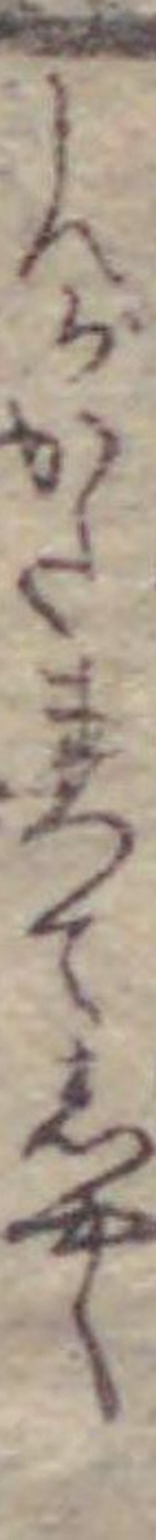しんがかたまつてしやく
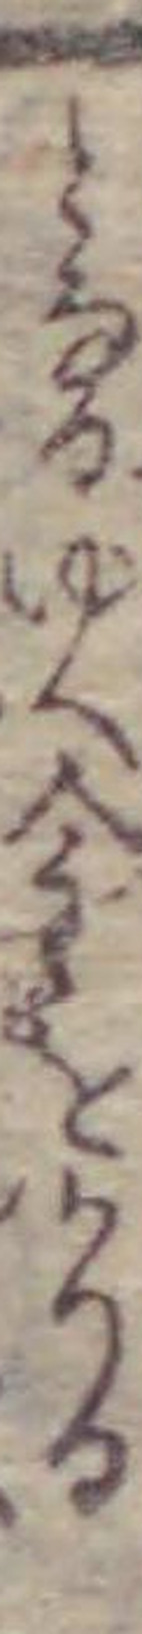となるゆへ金をかりる
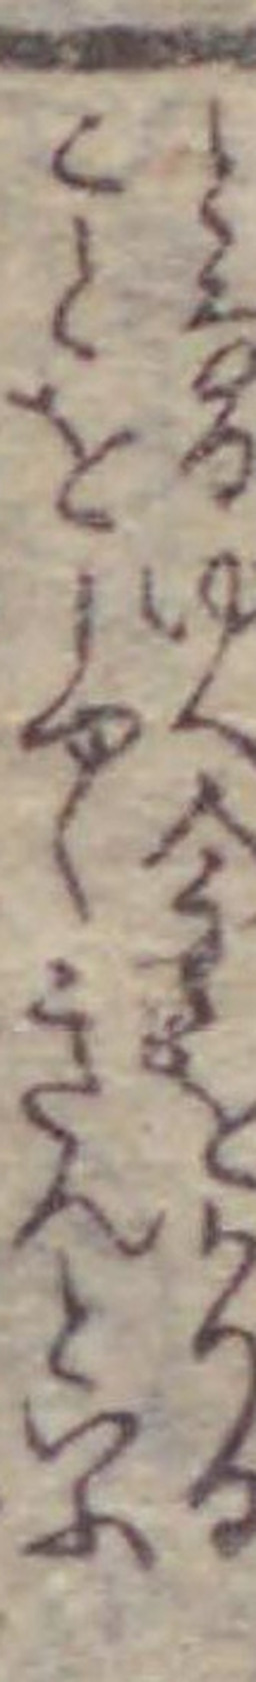ことをしやくきんといふ
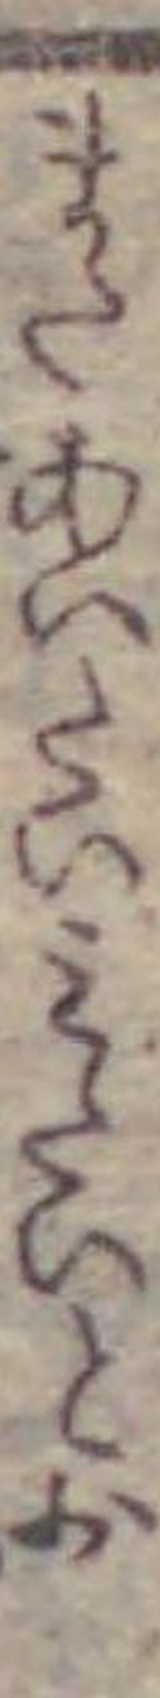またあいたいみたいとお
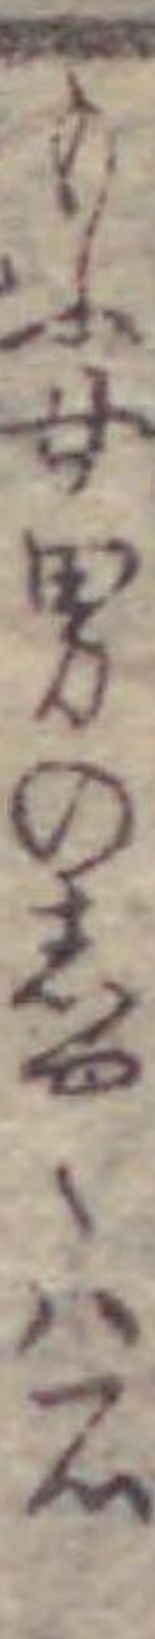もふ女男のしやくは石
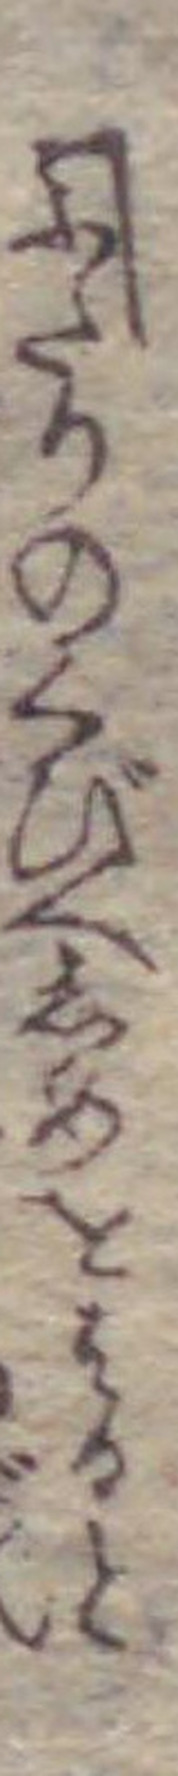〽ふたりのくびへしめをはると
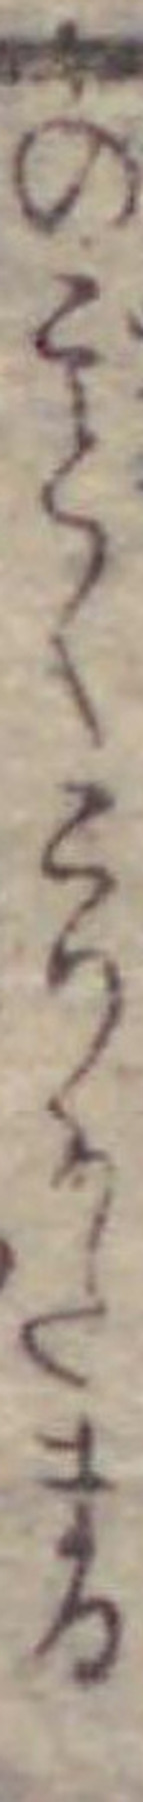のごとくこりかたまる
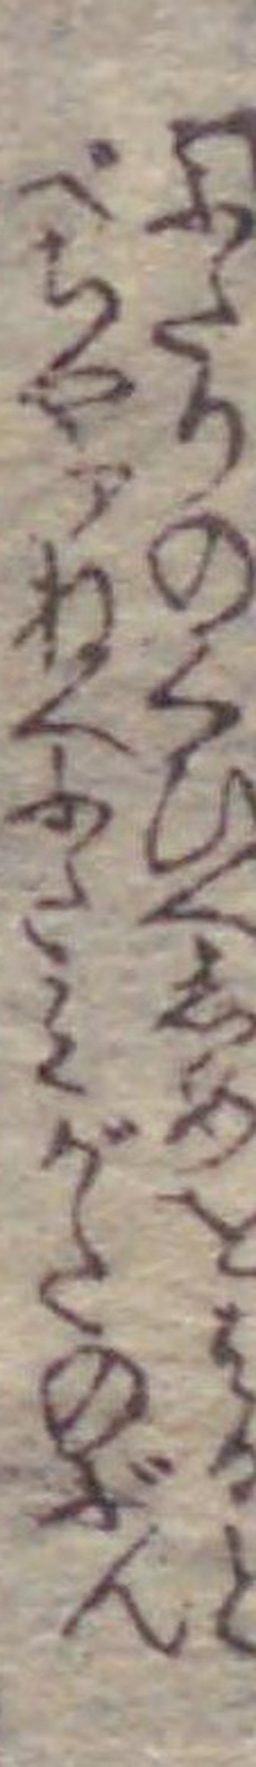べちやァねへふたみがたのぶん
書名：鼻下長生薬 : 3巻
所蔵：国立国会図書館 National Diet Library, JAPAN
